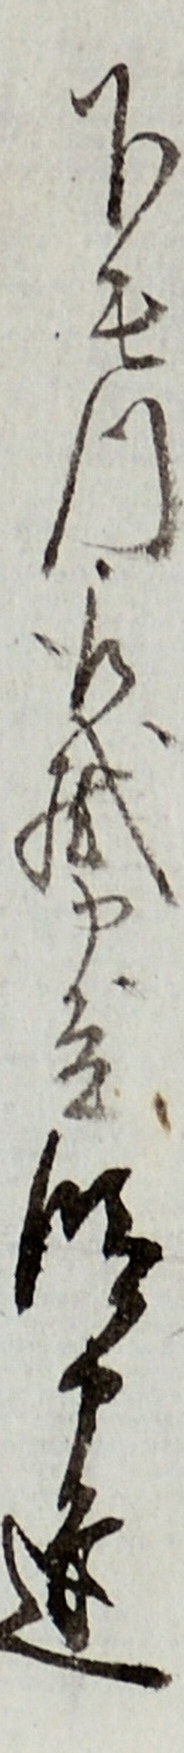下モ川取掛申度段申達
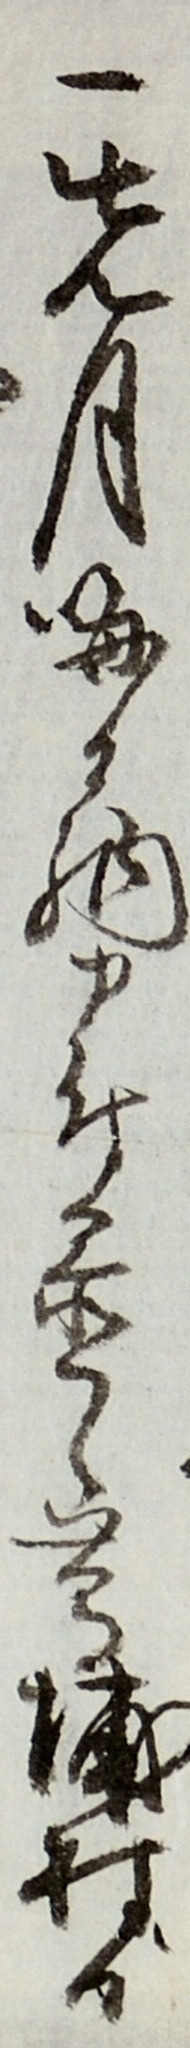一先月晦日納申付置候蔦浦村ゟ
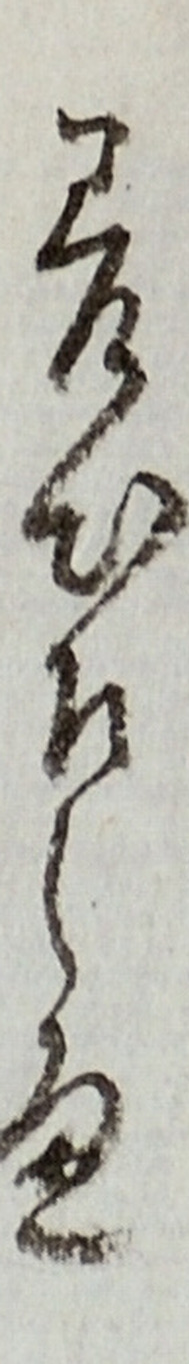差出左之通
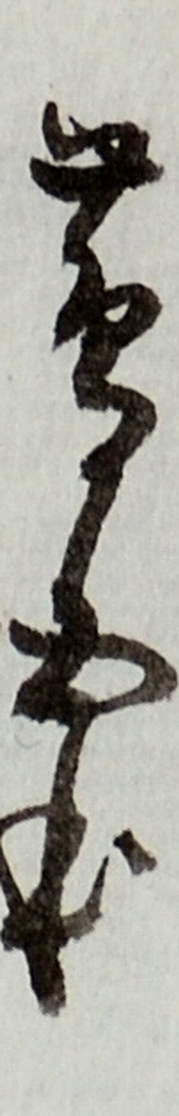蔦五本
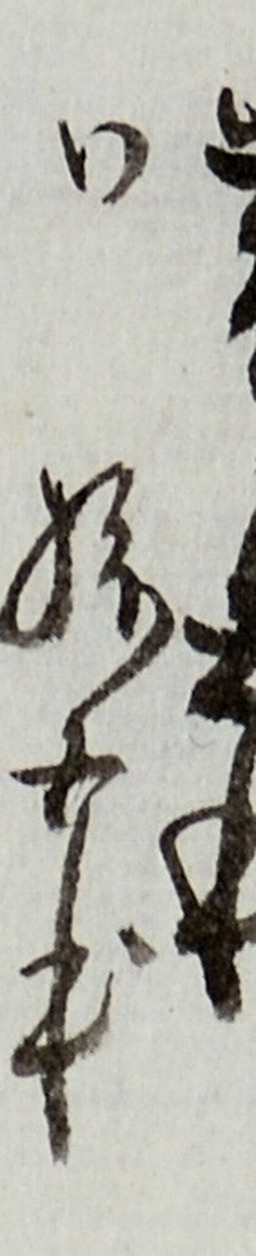同拾五本
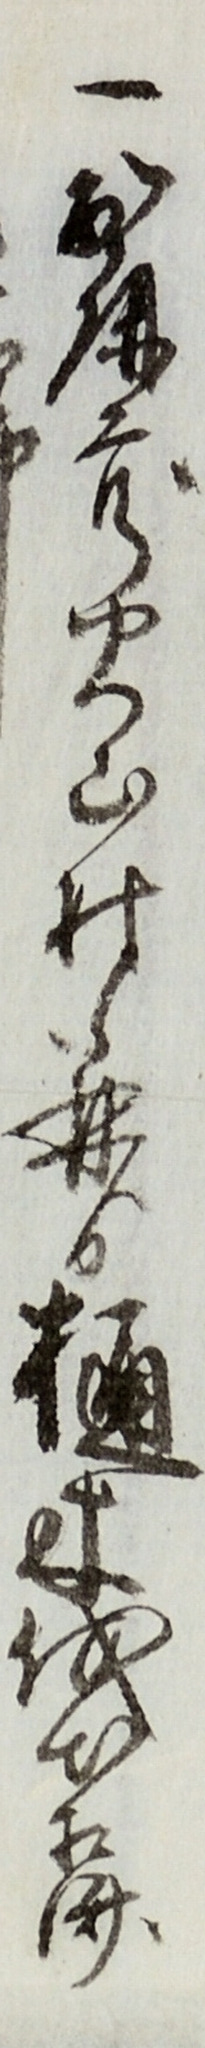一麗蔵火山村御林ゟ樋木伐出相済
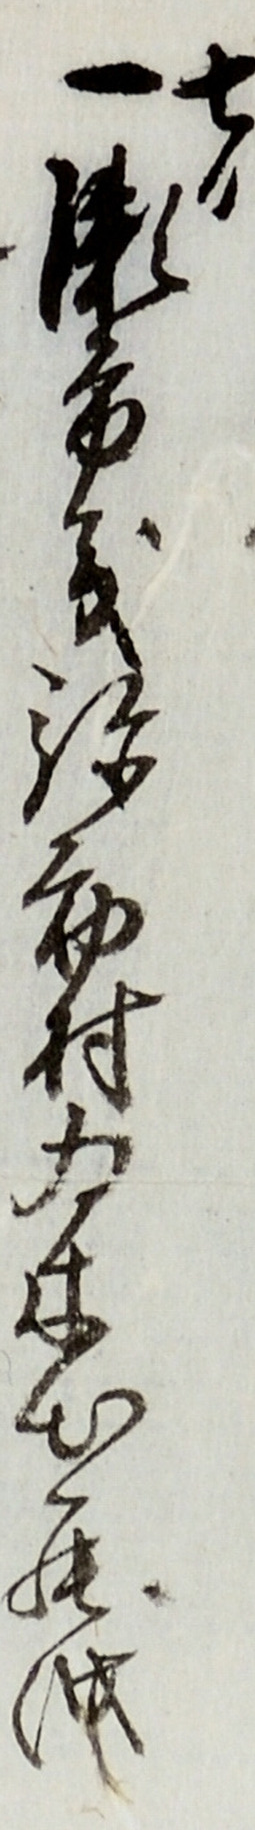一瀬市義弥勒村為木出罷越
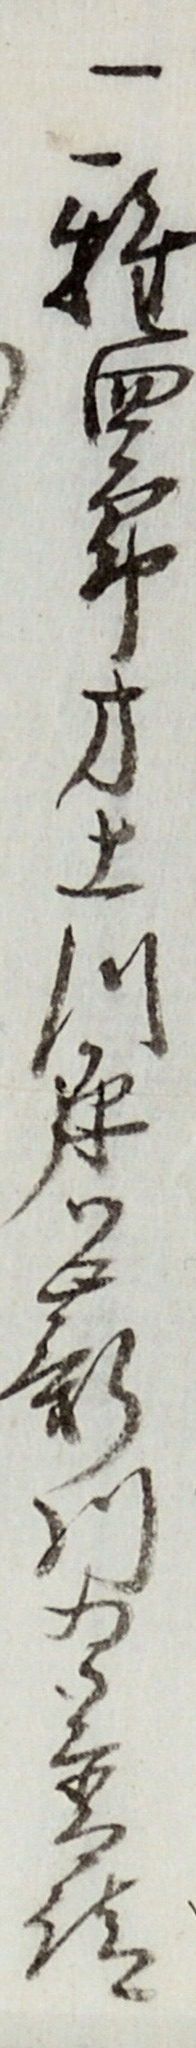一雅四郎方上川原御薪川為御普請
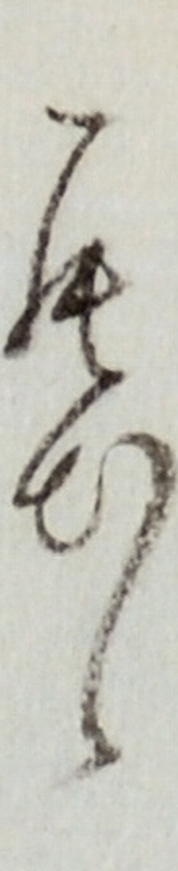罷出候
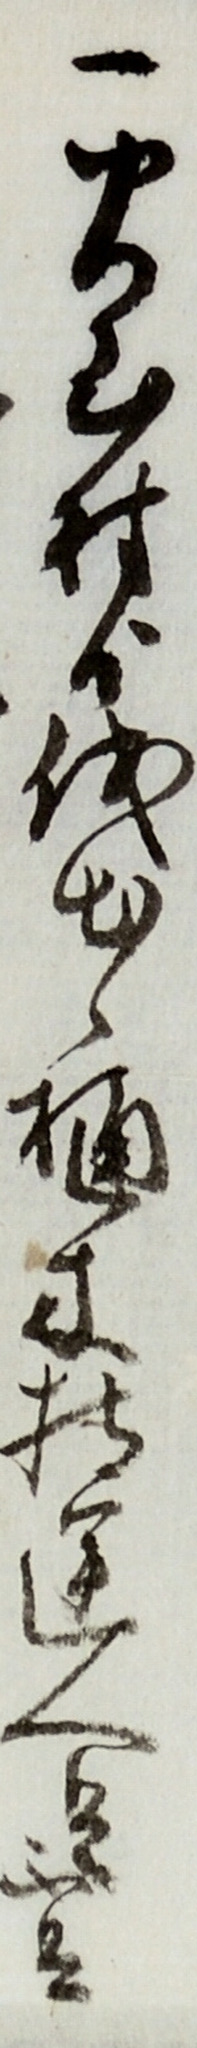一火山村ゟ伐出候樋木持運人足不足
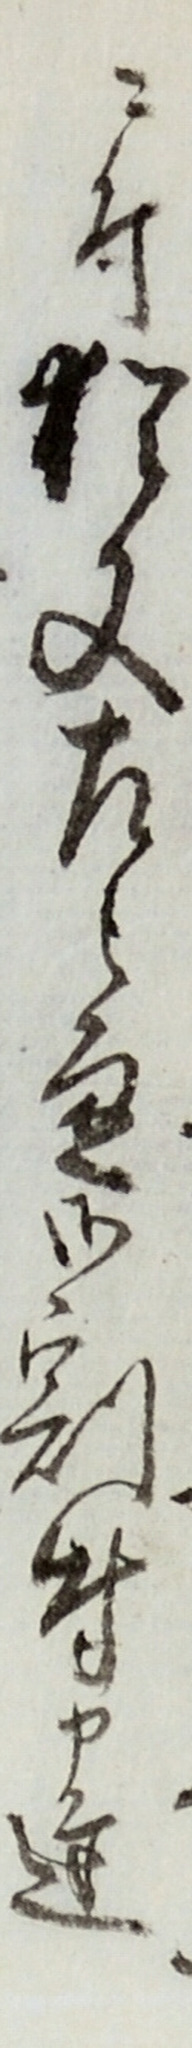ニ付猶又左之通御割付申達
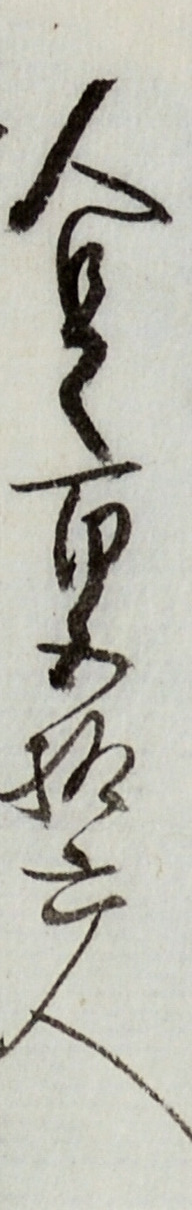人足百五拾六人
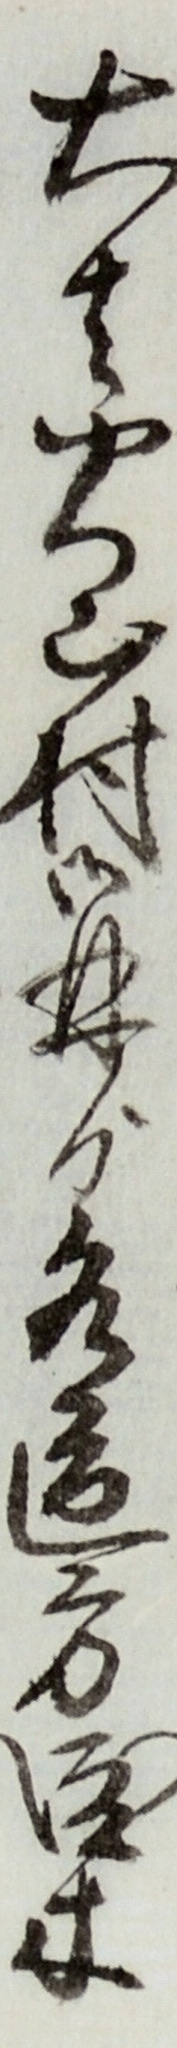右者火山村御林ゟ水道方渡木
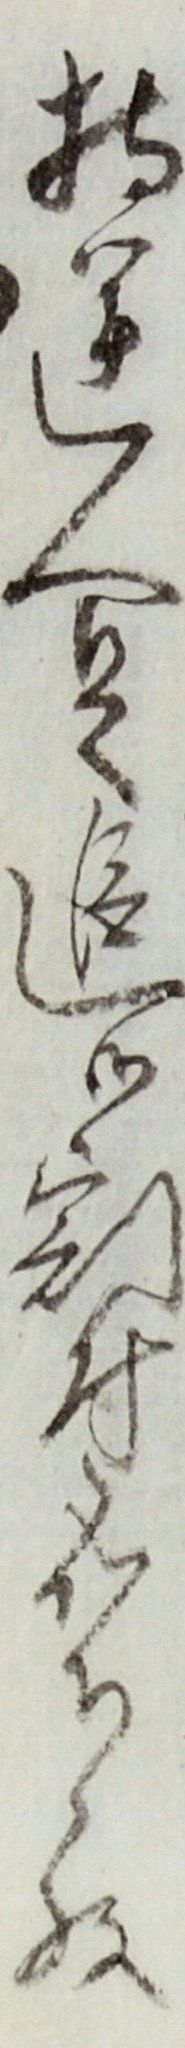持運人足追御割付被成下候様
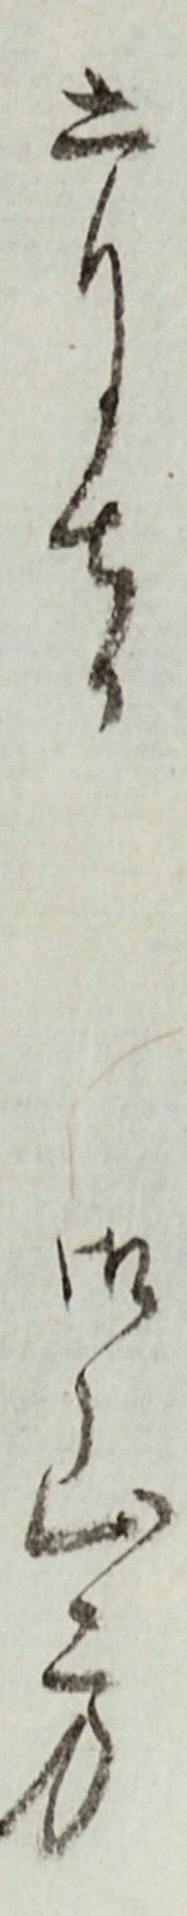六月七日御山方
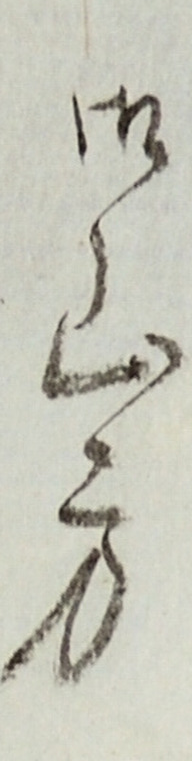御薪方
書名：御山方御薪方諸事御用留
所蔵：伊那市立高遠町図書館・合同会社AMANE
